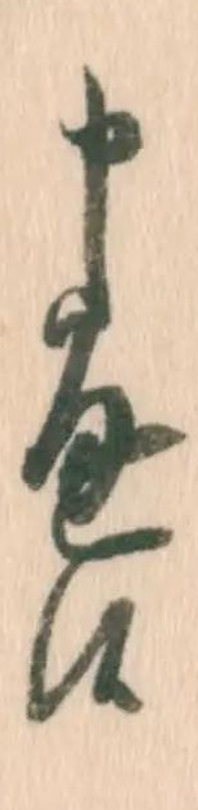申通候
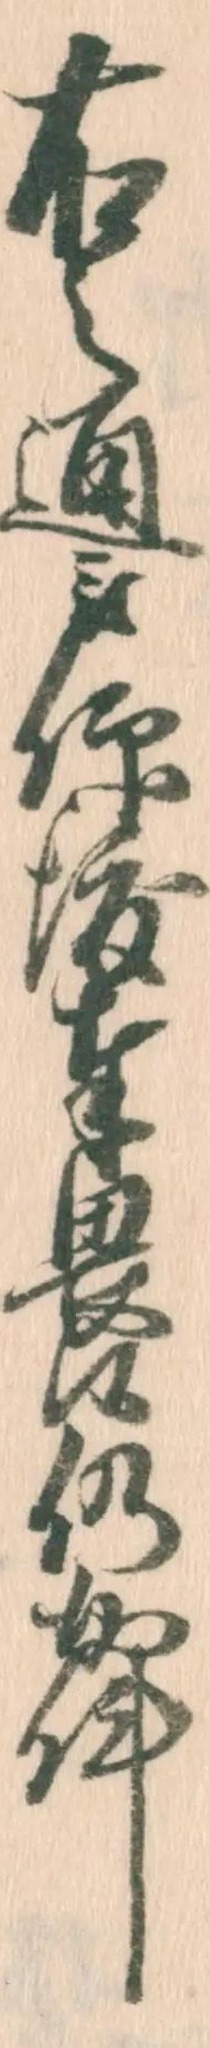右之通被仰渡奉畏候仍如件
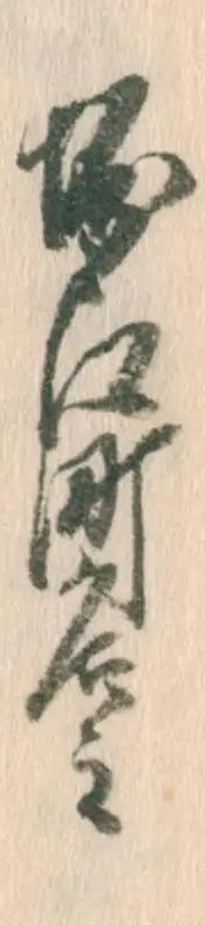堀江町名主
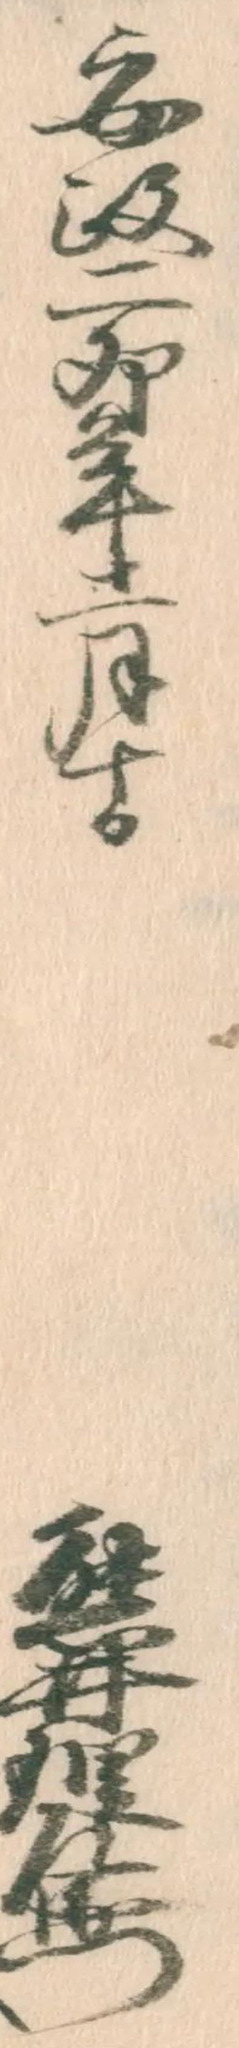安政二卯年十二月十日熊井理左衛門
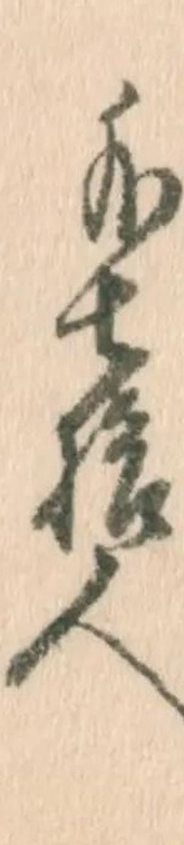外七拾人

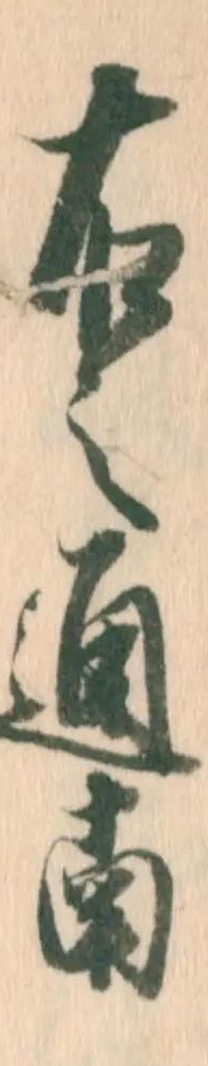右之通南
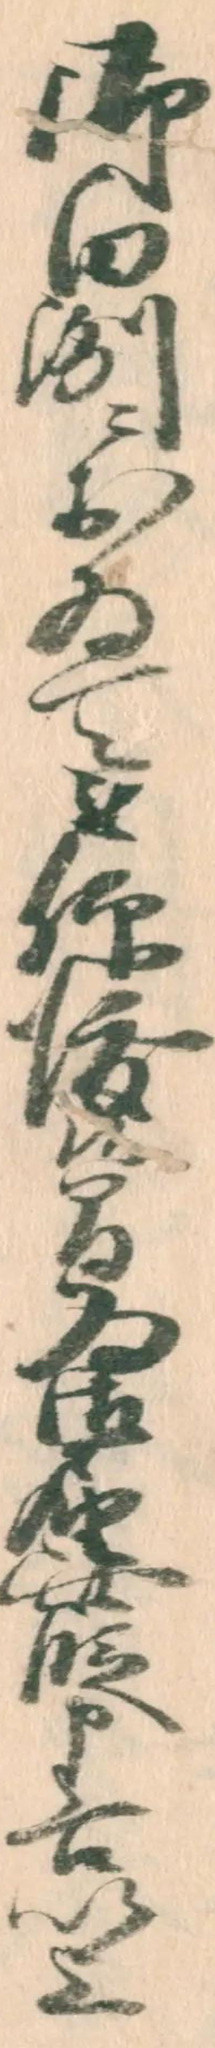御白洲ニおゐて被仰渡候間為御届此段申上候以上
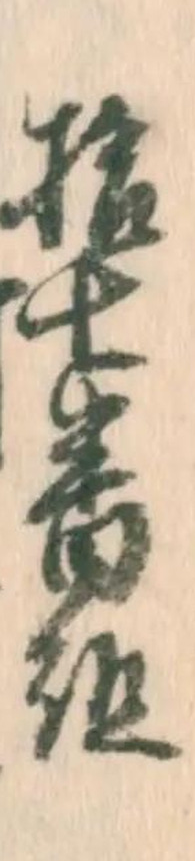拾七番組
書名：地震災書留 2巻. [1] 内表紙に「地震災書留　安政二卯年　但本所深川御用屋敷地代免除調」とあり
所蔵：国立国会図書館 National Diet Library, JAPAN
